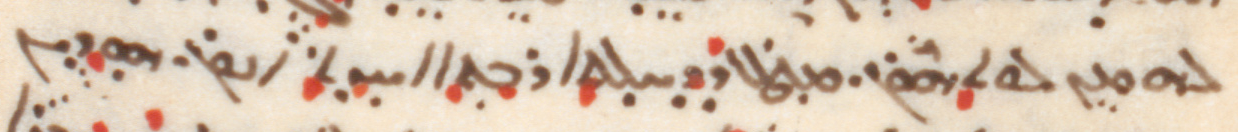ܠܗ ܡ̣ܢ ܠܘܬܗܘܢ. ܡܛܠ ܕܕܚܠܬܐ ܪܒܬܐ ܐܚܕܬ ܐܢܘܢ. ܗܘ ܕܝܢ
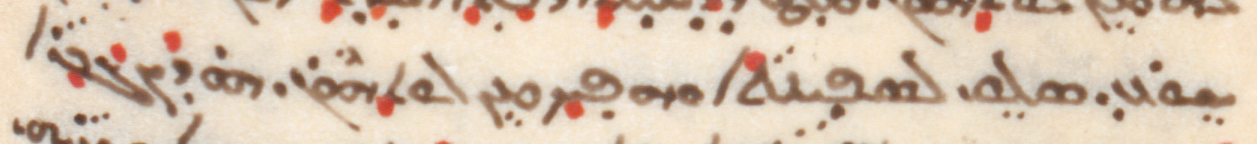ܝܫܘܥ܆ ܣܠ̣ܩ ܠܣܦܝܢܬܐ ܘܗܦ̣ܟ ܡ̣ܢ ܠܘܬܗܘܢ. ܗ̇ܘ ܕܝܢ ܓܒܪܐ
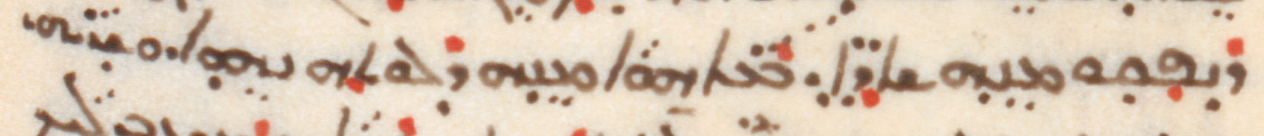ܕܢ̣ܦܩܘ ܡܢ̣ܗ ܫܐܕ̈ܐ܆ ܒܥܐ ܗܘܐ ܡܢ̣ܗ ܕܠܘܬܗ ܢܗܘ̣ܐ. ܘܫ̣ܪܝܗܝ
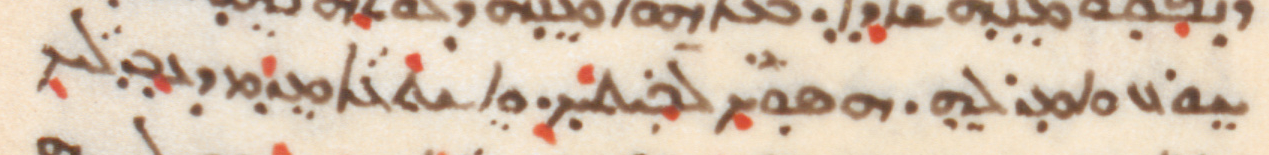ܝܫܘܥ ܘܐܡ̣ܪ ܠܗ. ܗܦܘܟ ܠܒܝܬܟ. ܘܐܫܬܥܐ ܡܕܡ ܕܥܒ̣ܕ ܠܟ
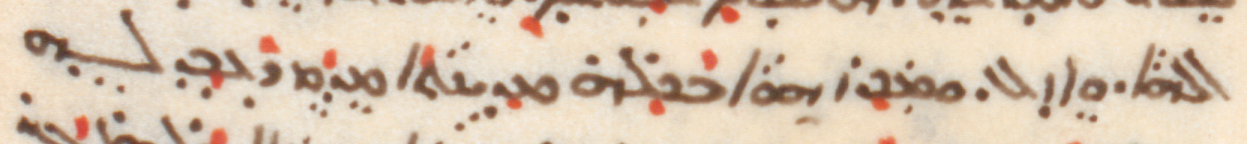ܐܠܗܐ. ܘܐܙܠ. ܘܡܟܪܙ ܗܘܐ ܒܟܠܗ̇ ܡܕܝܢܬܐ ܡܕܡ ܕܥܒ̣ܕ ܠܗ
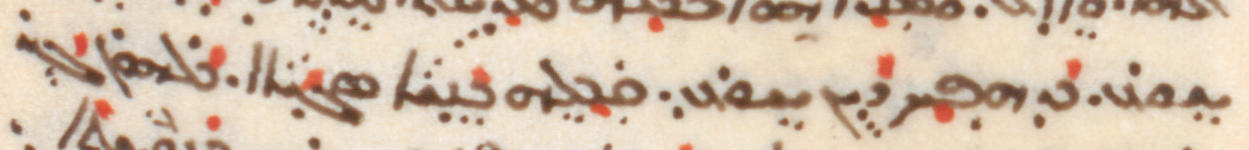ܝܫܘܥ. ܟܕ ܗܦ̣ܟ ܕܝܢ ܝܫܘܥ܆ ܩܒܠ̣ܗ ܟܢܫܐ ܣܓܝܐܐ. ܟܠܗܘܢ ܓܝܪ
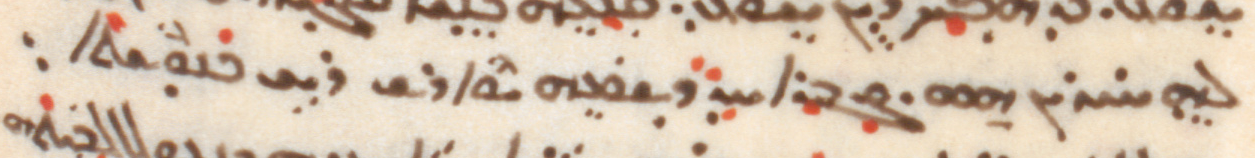ܠܗ ܚ̇ܝܪܝܢ ܗܘܘ. ܘܓܒܪܐ ܚܕ ܕܫܡܗ ܝܘܐܪܫ ܪܝܫ ܟܢܘܫܬܐ܆
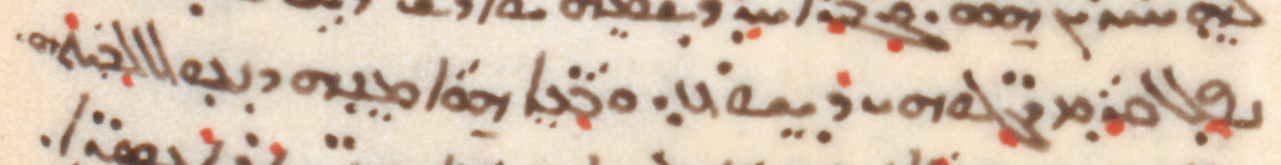ܢܦ̣ܠ ܩܕܡ ܪ̈ܓܠܘܗܝ ܕܝܫܘܥ܆ ܘܒܥܐ ܗܘܐ ܡܢܗ ܕܢܥܘܠ ܠܒܝܬܗ
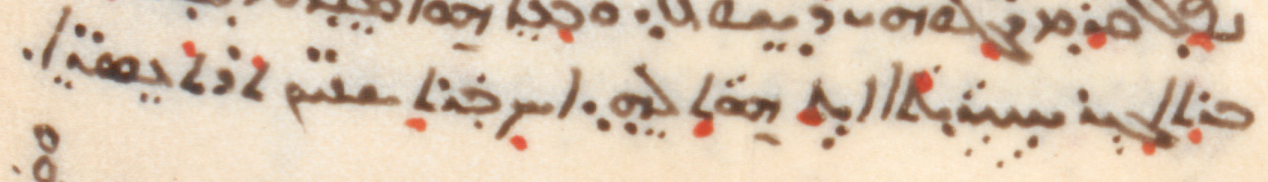ܒܪܬܐܓܝܪ ܝܚܝܕܝܬܐ ܐܝܬ ܗܘܬ ܠܗ܆ ܐܝܟ ܒܪܬ ܫܢܝ̈ܢ ܬܪܬܥܣܪ̈ܐ
